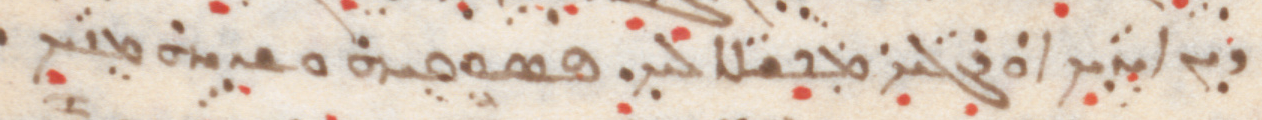ܕܝܢ ܐܝܕܟ ܐܘ ܪܓܠܟ ܡܟܫܠܐ ܠܟ. ܦܣܘܩܝܗ̇ ܘܫܕܝܗ̇ ܡܢܟ
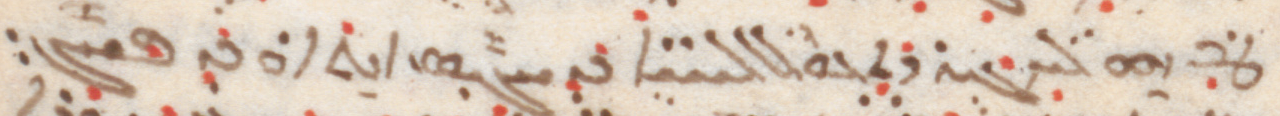ܛܒ ܗܘ ܠܟ ܓܝܪ ܕܬܥܘܠ ܠܚܝ̈ܐ ܟܕ ܚܓܝܣ ܐܢܬ ܐܘ ܟܕ ܦܫܝܓ܆
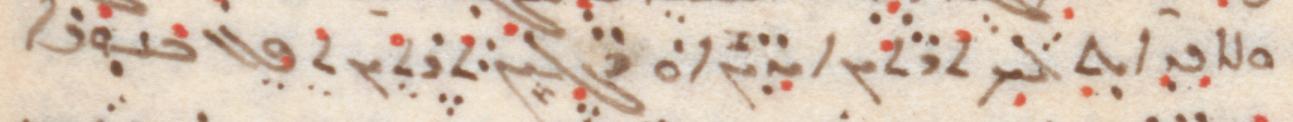ܘܠܐ ܟܕ ܐܝܬ ܠܟ ܬܪ̈ܬܝܢ ܐܝ̈ܕܝܢ ܐܘ ܪ̈ܓܠܝܢ: ܬܪܬܝܢ ܬܦܠ ܒܢܘܪܐ
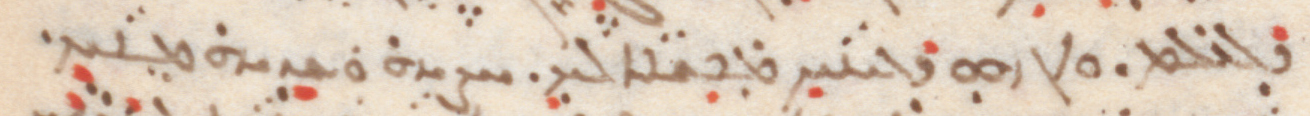ܕܠܥܠܡ. ܘܐܢ ܗܘ ܕܥܝܢܟ ܡܟܫܟܐ ܠܟ. ܝܨܝܗ̇ ܘܫܕܝܗ̇ ܡܢܟ
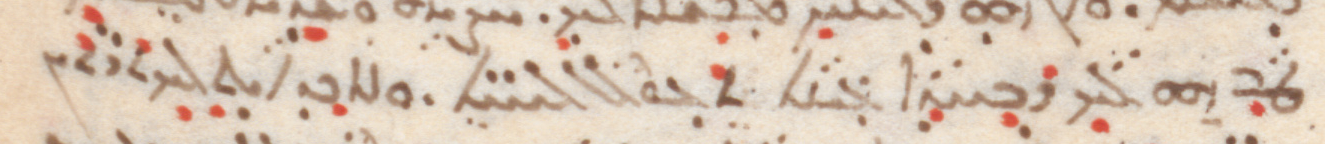ܛܒ ܗܘ ܠܟ ܕܒܚܕܐ ܥܝܢܐ ܬܥܘܠ ܠܚܝ̈ܐ. ܘܠܐ ܟܕ ܐܝܬ ܠܟ ܬܪ̈ܬܝܢ
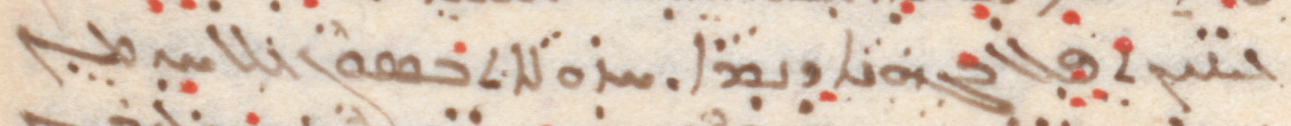ܥܝܢ̈ܝܢ ܬܦ̣ܠ ܒܓܗܢܐ ܕܢܘܪܐ. ܚܙܘ ܠܐ ܬܒܣܘܢ ܥܠ ܚܕ ܡ̣ܢ
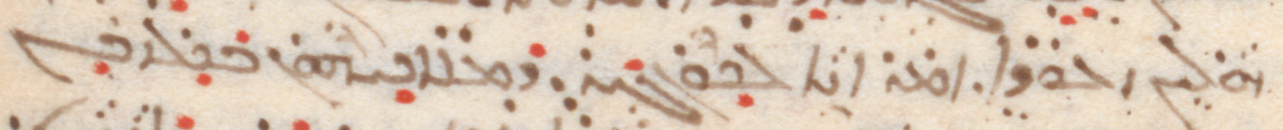ܗܠܝܢ ܙܥܘ̈ܪܐ. ܐܡ̇ܪ ܐܢܐ ܠܟܘܢ ܓܝܪ܆ ܕܡܠܐ̈ܟܝܗܘܢ ܒܟܠܙܒܢ
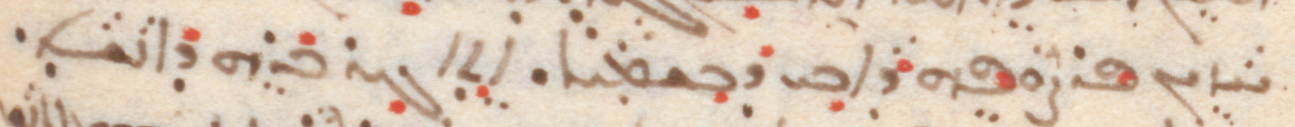ܚܙܝܢ ܦܪܨܘܦܗ ܕܐܒܝ ܕܒܫܡܝܐ. ܐܬ̣ܐ ܓܝܪ ܒܪܗ ܕܐܢܫܐ.
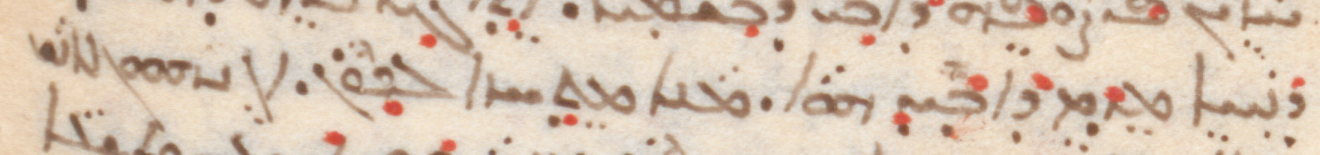ܕܢܚܐ ܡܕܡ ܕܐܒܝܕ ܗܘܐ. ܡܢܐ ܡܬܚܙܐ ܠܟܘܢ܇ ܐܢ ܢܗܘܘܢ ܠܐܢܫ
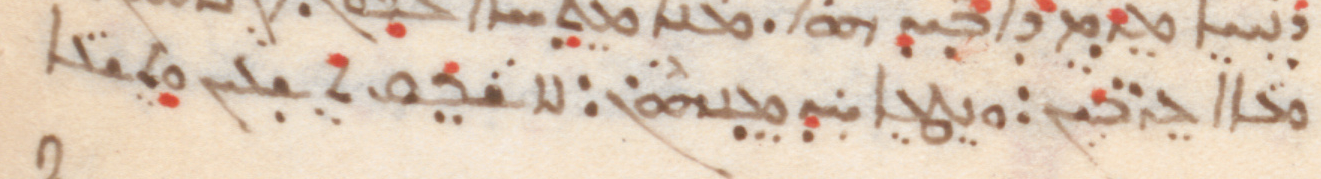ܡܐܐ ܥܪ̈ܒܝܢ: ܘܢܛܐ ܚܕ ܡܢܗܘܢ܆ ܠܐ ܫܒܩ ܬܫܥܝܢ ܘܬܫܥܐ
